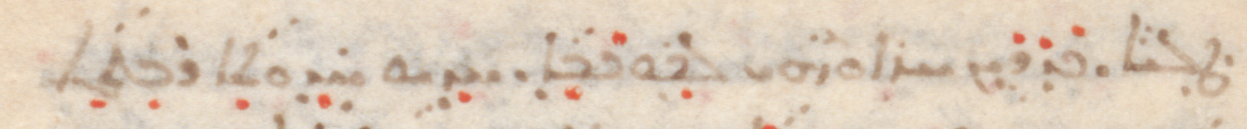ܛܠܝܐ. ܟܕ ܕܝܢ ܚܙܐܘܗܝ ܠܟܘܟܒܐ܆ ܚܕܝܘ ܚܕܘܬܐ ܪܒܬܐ
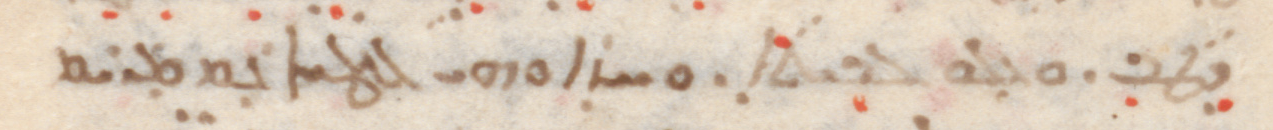ܕܛܒ. ܘܥܠܘ ܠܒܝܬܐ܆ ܘܚܙܐܘܗܝ ܠܛܠܝܐ ܥܡ ܡܪܝܡ
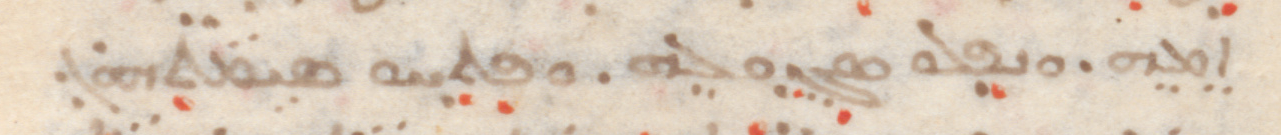ܐܡܗ. ܘܢܦ̣ܠܘ ܣܓܕܘ ܠܗ. ܘܦܬ̣ܚܘ ܣܝܡܬ̈ܗܘܢ܆
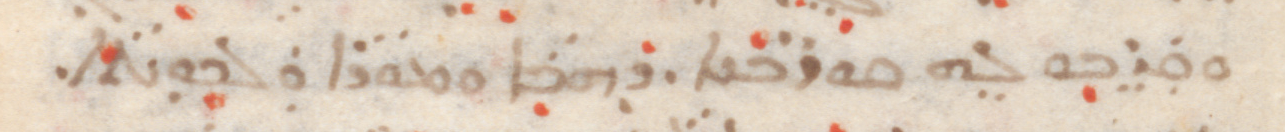ܘܩܪܒܘ. ܠܗ ܩܘܪܒܢܐ. ܕܗܒܐ ܘܡܘܪܐ ܘܠܒܘܢܬܐ.
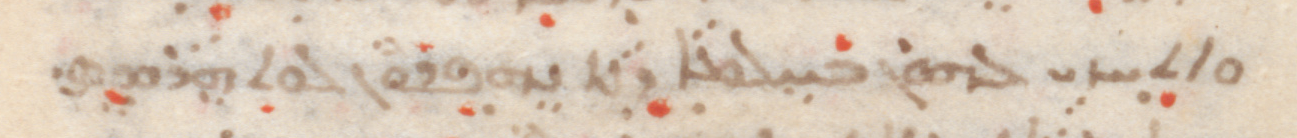ܘܐܬܚܙܝ ܠܗܘܢ ܒܚܠܡܐ ܕܠܐ ܢܗܦܟܘܢ ܠܘܬ ܗܪܘܕܣ.
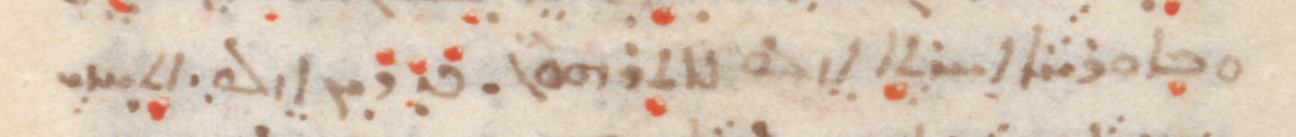ܘܒܐܘܪܚܐ ܐܚܪܬܐ ܐܙܠܘ ܠܐܬܪܗܘܢ. ܟܕ ܕܝܢ ܐܙܠܘ܆ ܐܬܚܙܝ
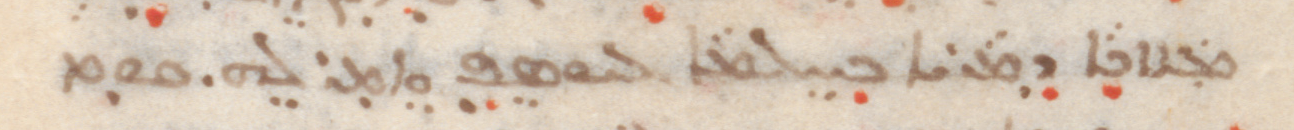ܡܠܐܟܐ ܕܡܪܝܐ ܒܚܠܡܐ ܠܝܘܣܦ ܘܐܡ̣ܪ ܠܗ. ܩܘܡ
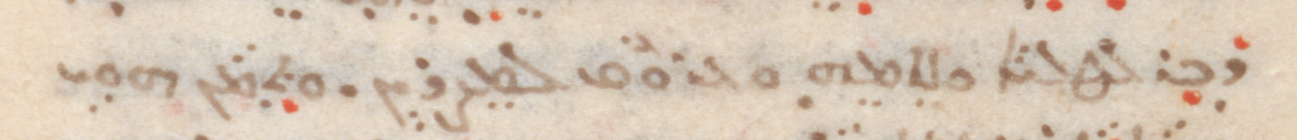ܕܒܪ ܠܛܠܝܐ ܘܠܐܡܗ ܘܥܪܘܩ ܠܡܨܪܝܢ. ܘܬܡܢ ܗܘܝ
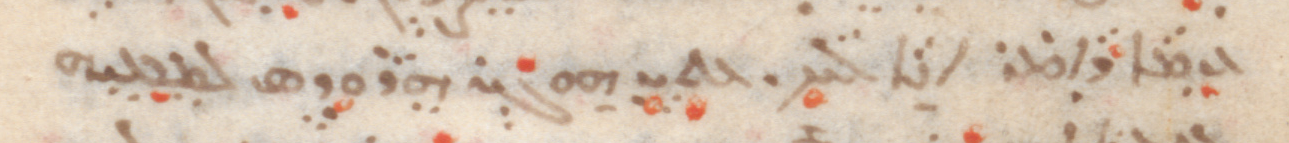ܥܕܡܐ ܕܐܡ̇ܪ ܐܢܐ ܠܟ. ܥܬܝܕ ܗܘ ܓܝܪ ܗܪܘܕܣ ܠܡܒܥܝܗ
